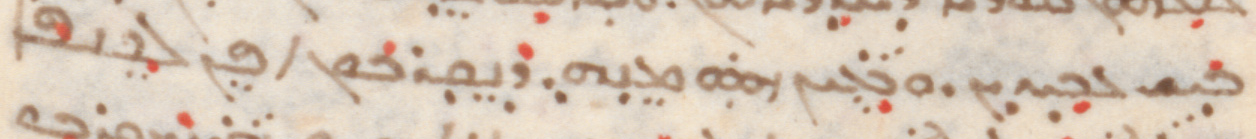ܒܝܫ ܥܒܝܕܝܢ. ܘܒ̇ܥܝܢ ܗܘܘ ܡܢܗ܆ ܕܢܩܪܒܘܢ ܐܦܢ ܠܟܢܦܐ
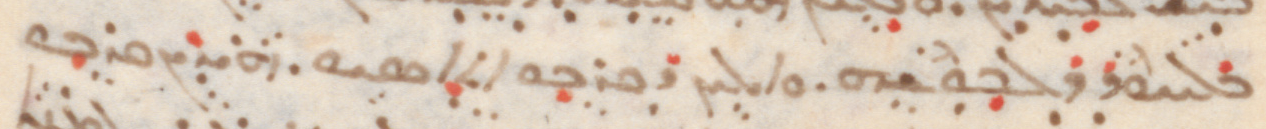ܒܠܚܘܕ ܕܠܒܘܫܗ. ܘܐܝܠܝܢ ܕܩܪܒܘ ܐܬܐܣܝܘ. ܗܝܕܝܢ ܩܪܒܘ
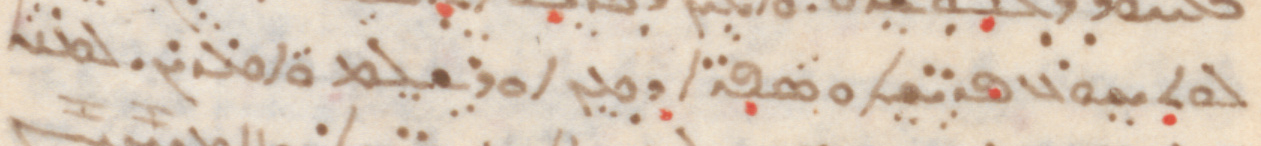ܠܘܬ ܝܫܘܥ ܦܪ̈ܝܫܐ ܘܣܦܪ̈ܐ ܕܡܢ ܐܘܪܫܠܡ ܘܐܡ̇ܪܝܢ. ܠܡܢܐ
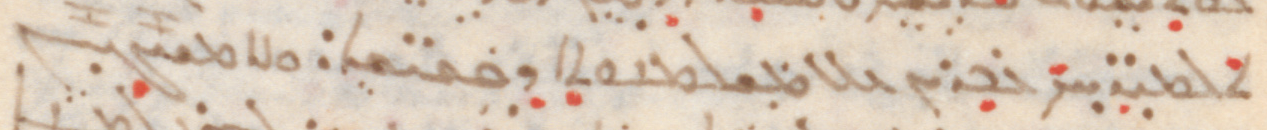ܬܠܡܝܕ̈ܝܟ ܥܒܪܝܢ ܥܠ ܡܫܠܡܢܘܬܐ ܕܩܫܝ̈ܫܐ: ܘܠܐ ܡܫܝܓܝܢ
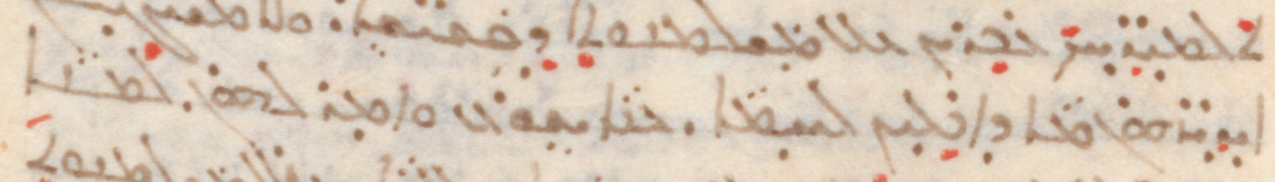ܐܝܕܝ̈ܗܘܢ ܡܐ ܕܐܟܠܝܢ ܠܚܡܐ. ܥܢܐ ܝܫܘܥ ܘܐܡ̣ܪ ܠܗܘܢ: ܠܡܢܐ
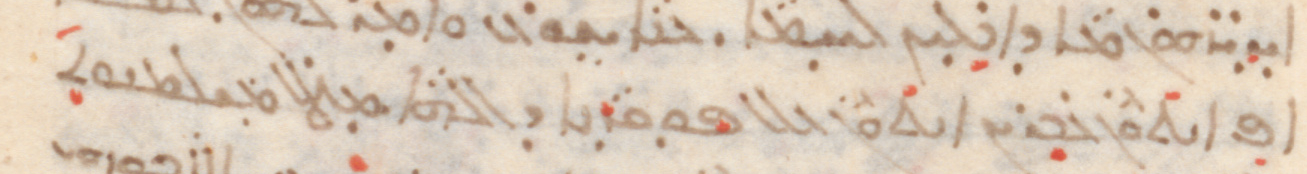ܐܦ ܐܢܬܘܢ ܥܒܪܝܢ ܐܢܬܘܢ ܥܠ ܦܘܩܕܢܐ ܕܐܠܗܐ ܡܛܠ ܡܫܠܡܢܘܬ
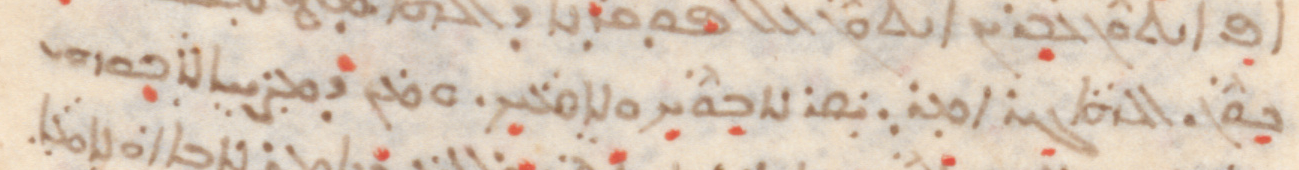ܟܘܢ . ܐܠܗܐ ܓܝܪ ܐܡ̣ܪ܆ ܝܩܪ ܠܐ ܒܘܟ ܘܠܐܡܟ. ܘܡ̇ܢ ܕܡܨܚܐ ܠܐܒܘܗܝ
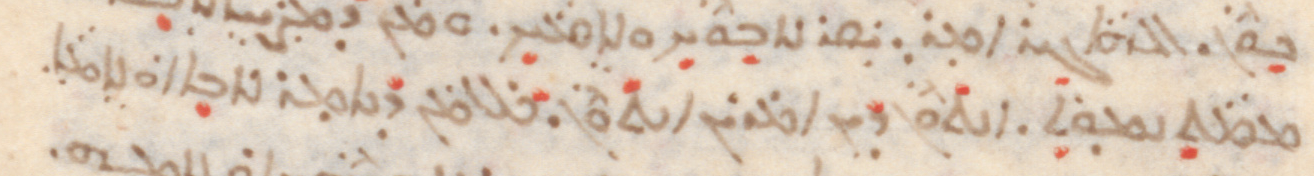ܡܡܬ ܢܡܘܬ. ܐܢܬܘܢ ܕܝܢ ܐܡ̇ܪܝܢ ܐܢܬܘܢ܆ ܟܠ ܡ̇ܢ ܪܢܐܡ̣ܪ ܠܐܒܐ ܐܘ ܠܐܡܐ
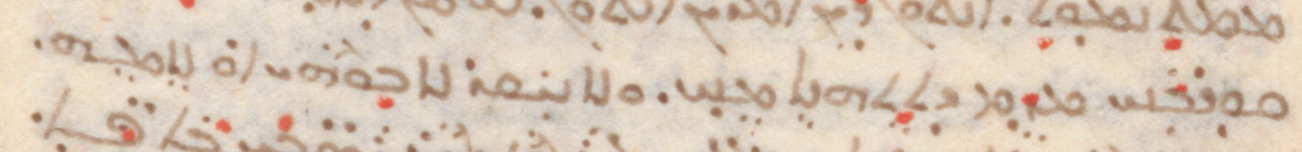ܩܘܪܒܢܝ ܡܕܡ ܕܬܬܗܢܐ ܡܢܝ. ܘܠܐ ܢܝܩܪ ܠܐܒܘܗܝ ܐܘ̇ ܠܐܡܗ.
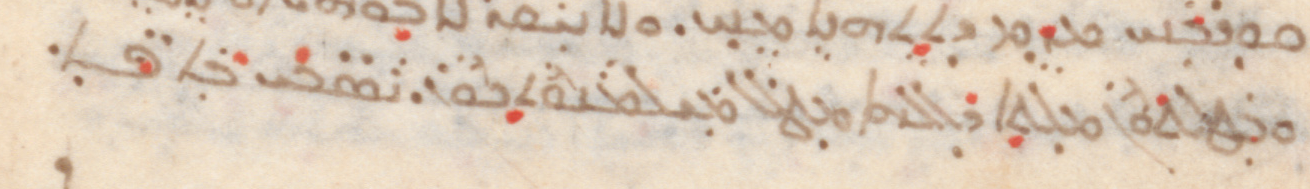ܘܒܛܠܬܘܢ ܡܠܬܐ ܕܐܠܗܐ ܡܛܠ ܡܫܠܡܢܘܬܟܘܢ: ܢܣ̈ܒܝ ܒܐܦ̈ܐ܆
